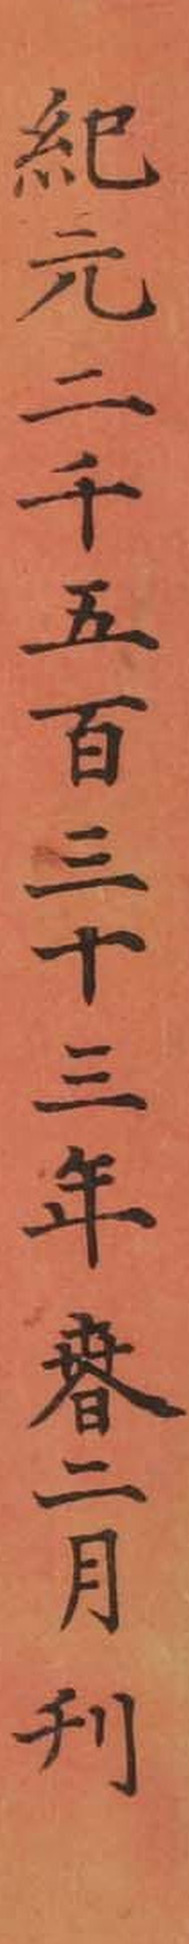紀元二千五百三十三年春二月刊

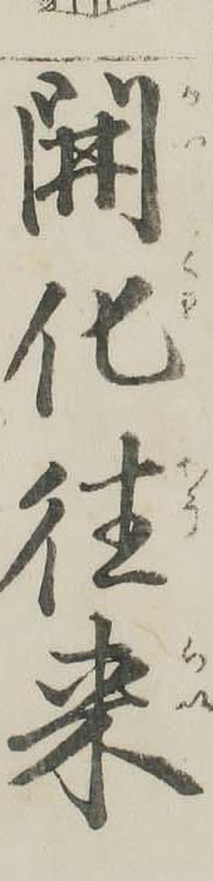開化往来
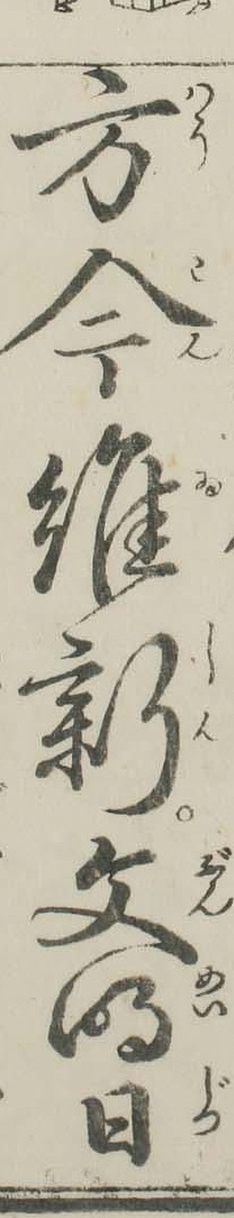方今維新。文明日
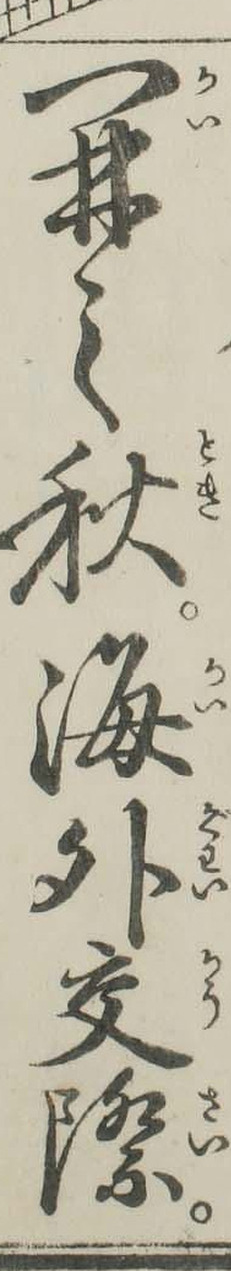開之秋。海外交際。
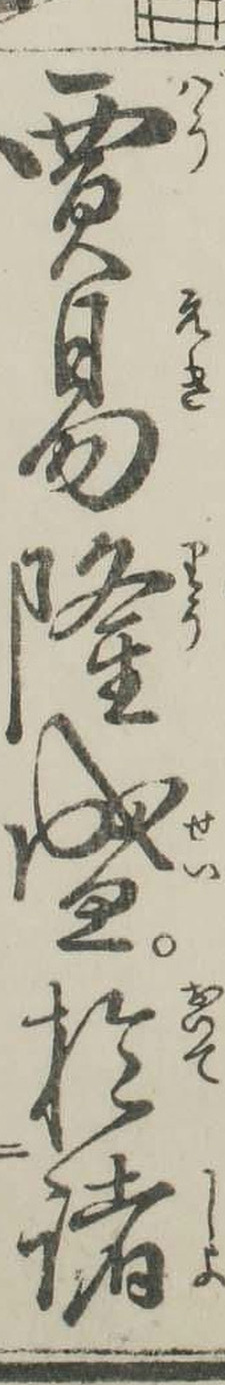賈易隆盛。於諸
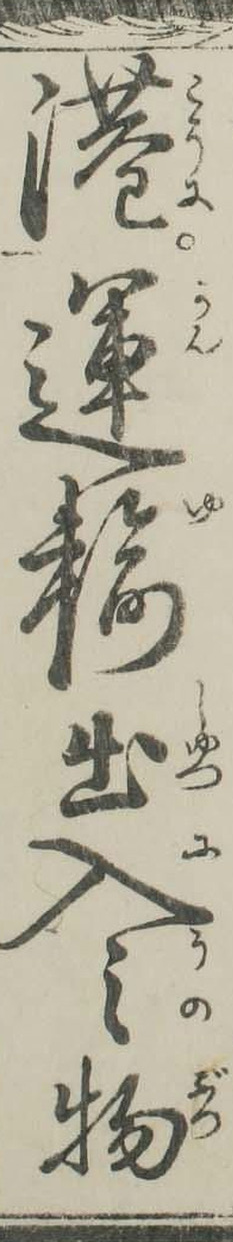港。運輸出入之物

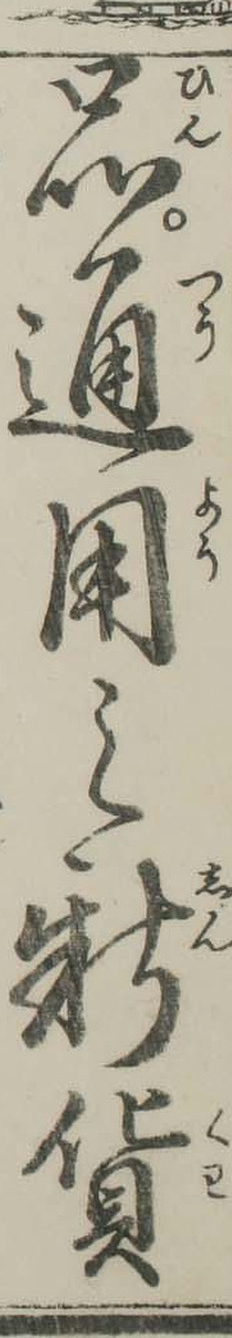品。通用之新貨
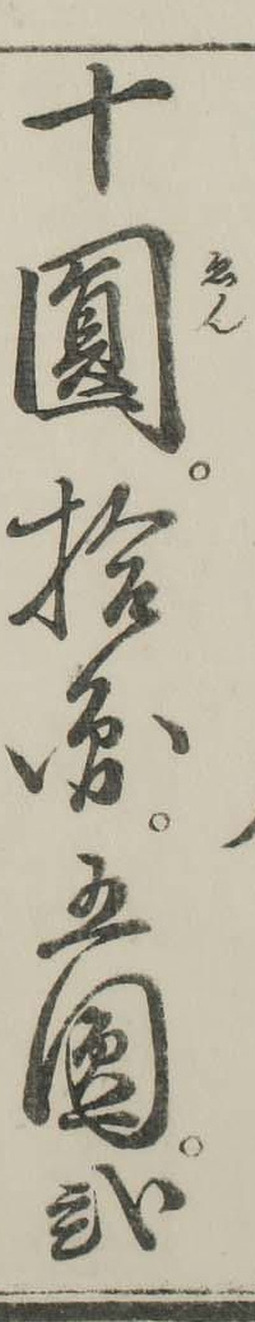十円。拾円。五円。弐
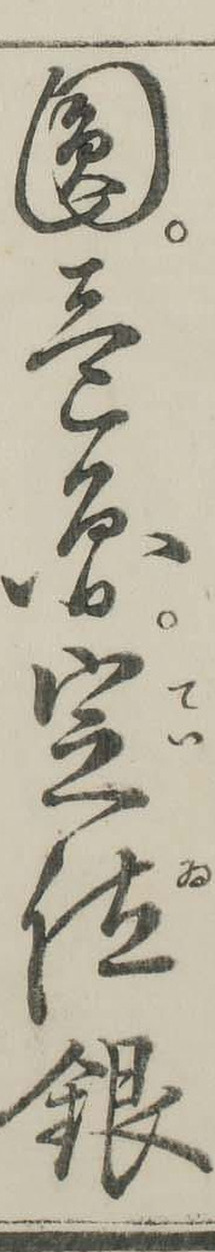円。壱円。定位銀
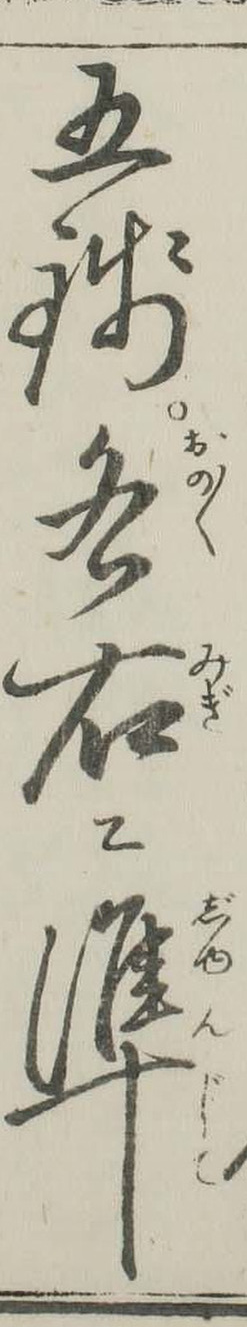五銭。各右に準
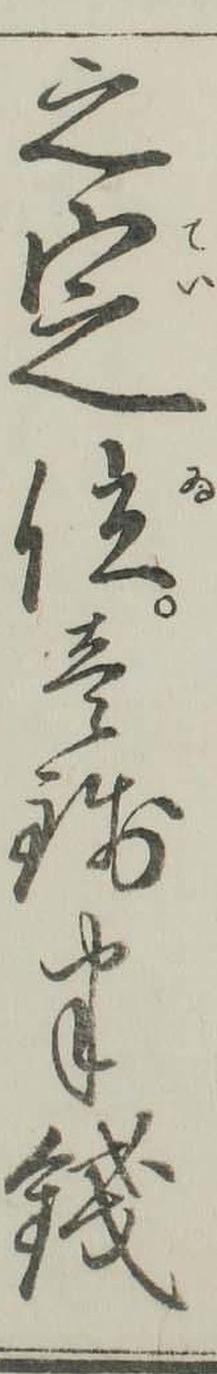之定位。壱銭半銭
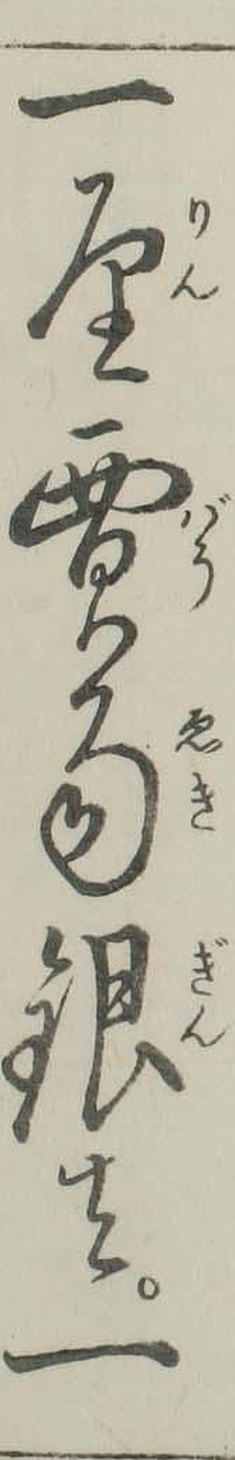一厘賈易銀は。一

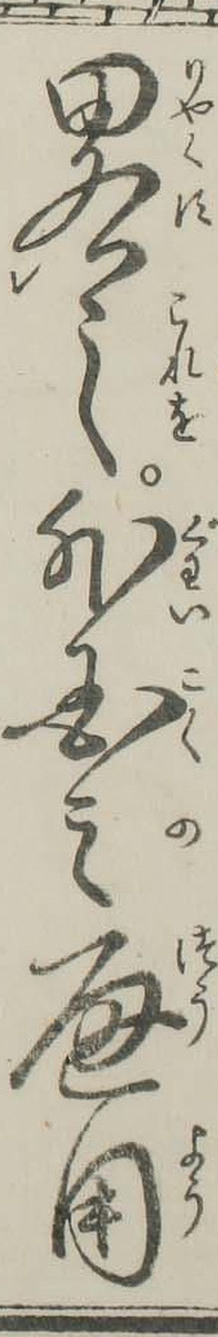略之。外国之通用
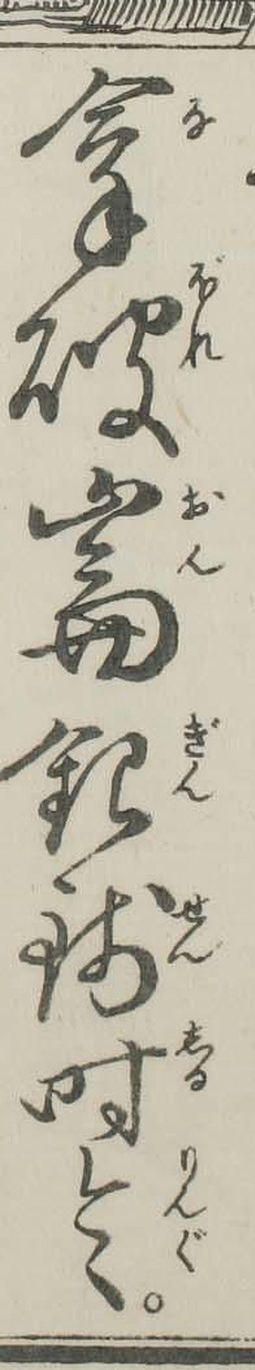拿破崙銀銭時令。
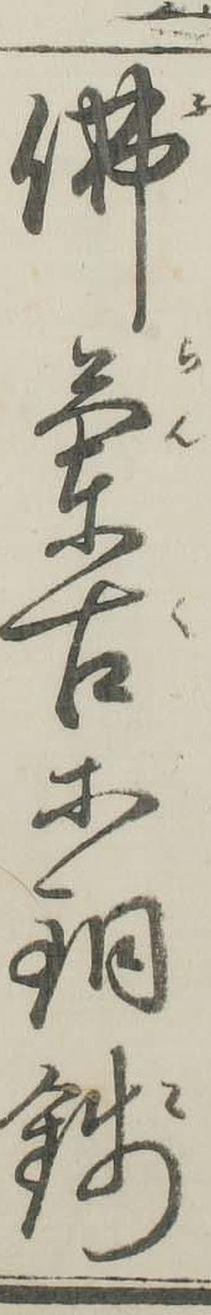仏蘭古等銅銭
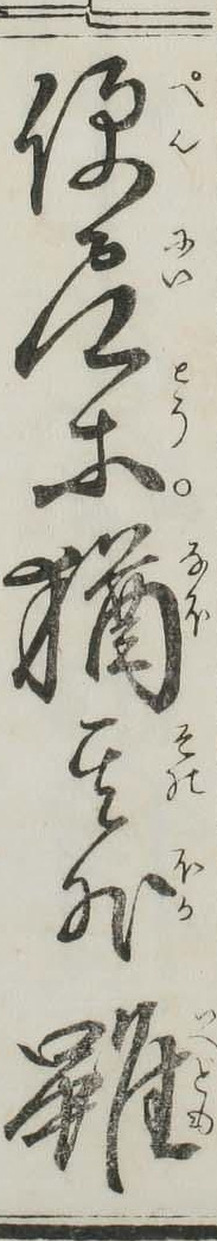便尼等。猶其外雖
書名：開化往来
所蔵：東京学芸大学教育コンテンツアーカイブ
